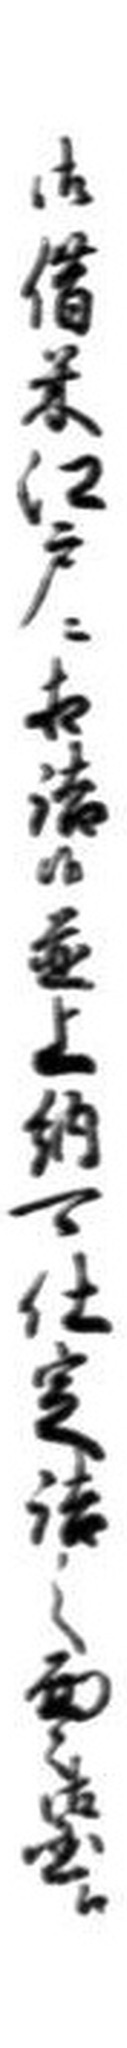御借米江戸ニ相詰候並上納可仕定詰之面々御国江
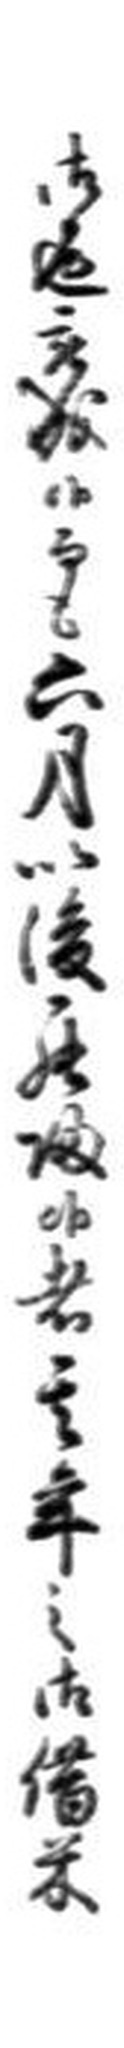御返被成候而も六月以後罷帰候者其年之御借米
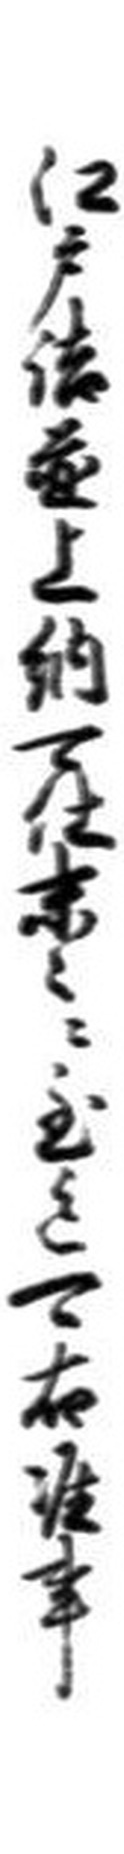江戸詰並上納可仕末々ニ至迄可右准事
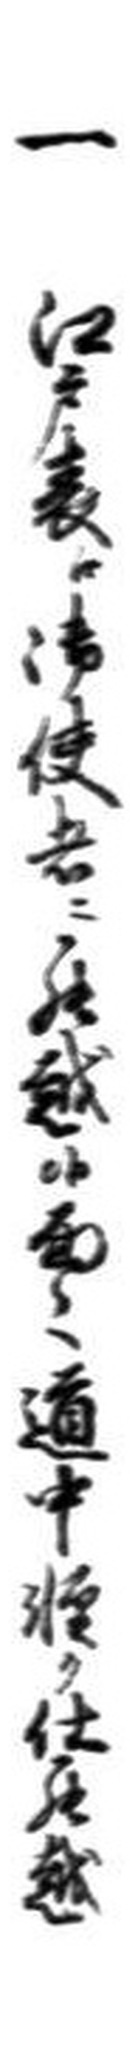一江戸表江御使者ニ罷越候面々道中軽ㇰ仕罷越
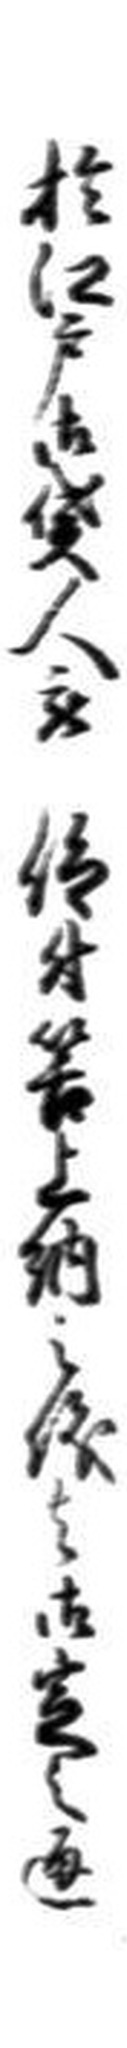於江戸御貸人被仰付筈上納之儀者御定之通
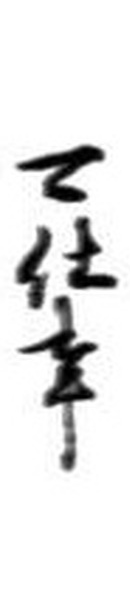可仕事
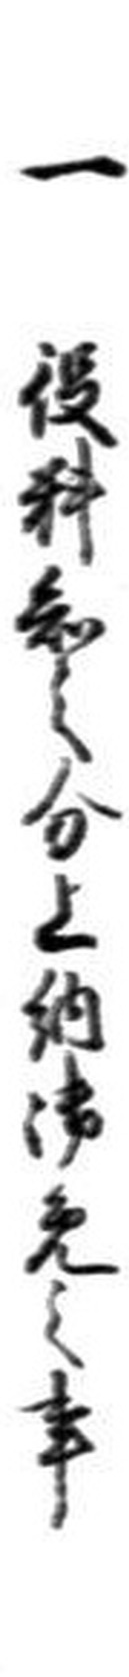一役料知之分上納御免之事

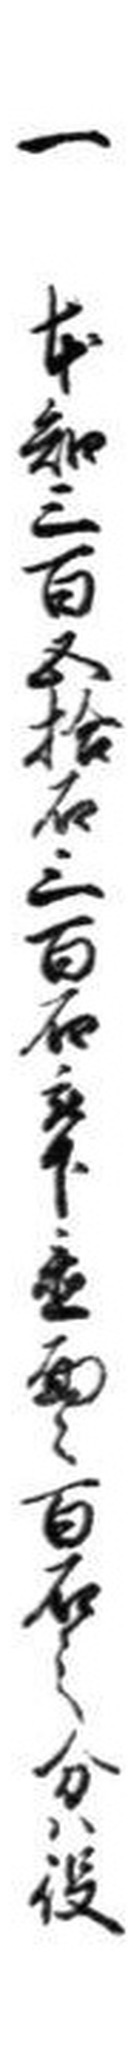一本知三百五拾石三百石被下置面々之百石之分ハ役
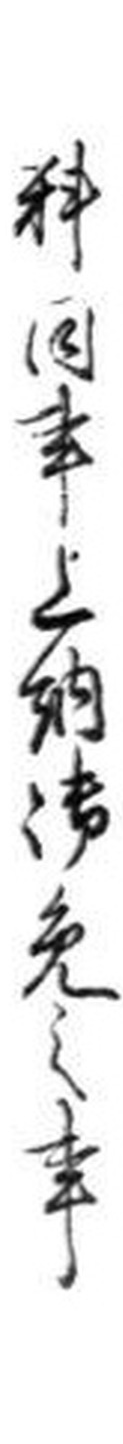料同事上納御免之事
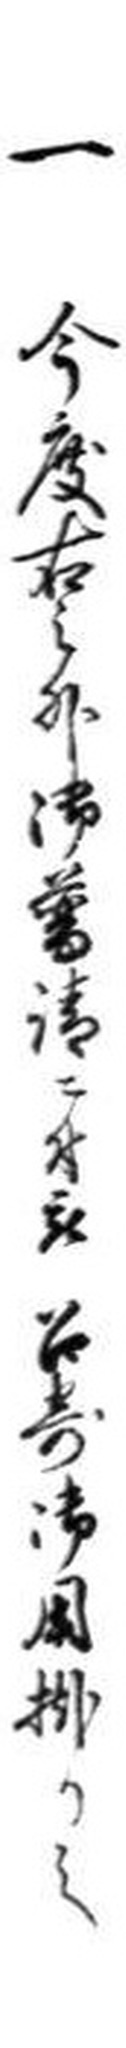一今度右之外御普請ニ付被召寄御用掛リ之
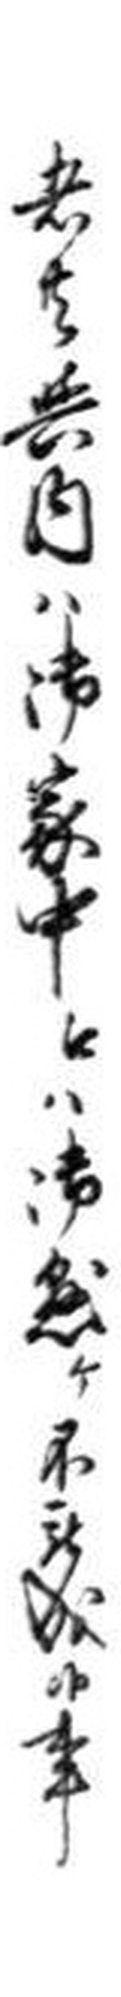者共与内ハ御家中江ハ御懸ヶ不被成候事
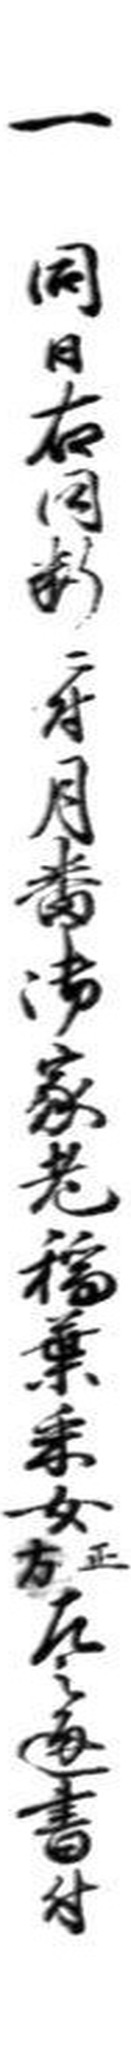一同日右同断ニ付月番御家老稲葉采女正方左之通書付
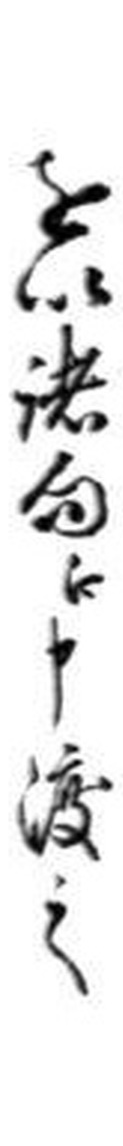を以て諸向江申渡之
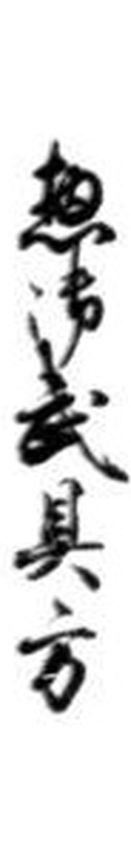惣御武具方
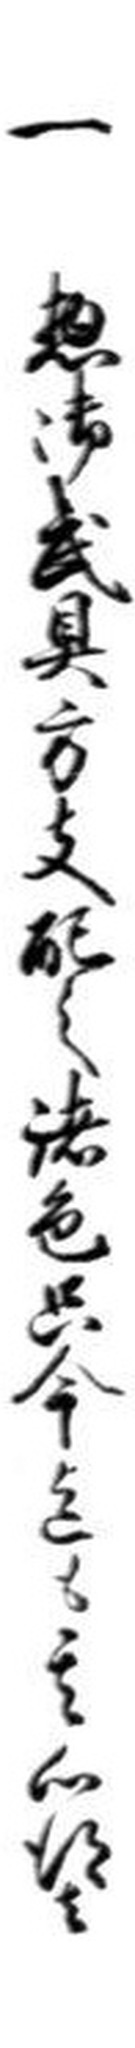一惣武具方支配之諸色只今迄も其心得者
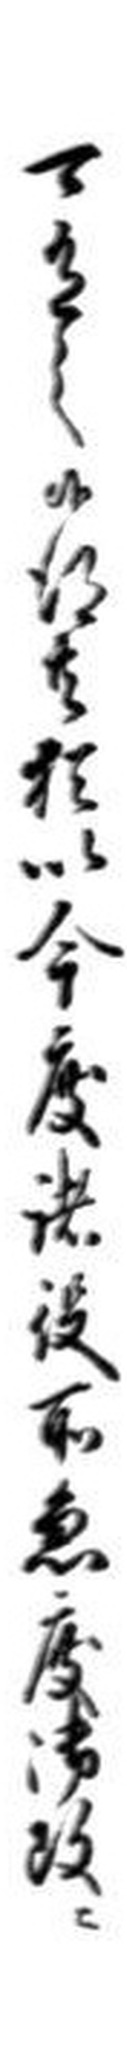可有之候得共猶以今度諸役所急度御改ニ
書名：家譜 三十一 吉邦公 享保元年
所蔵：福井県文書館 Fukui Prefectural Archives
